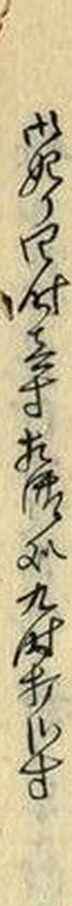御始り四時壱寸相済候処九時打弐寸
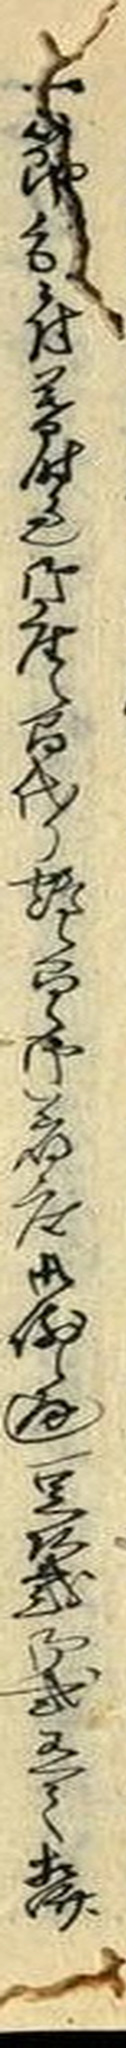一節分ニ付暮時迄御座之間代り鶴之間へ御着座御例之通豆頂戴御式有之相済
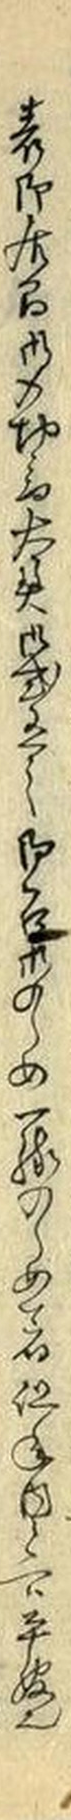表御居間御〆切ニ而大奥御式有之御召御のしめ一統のしめ着但年内ニ候へハ平服也
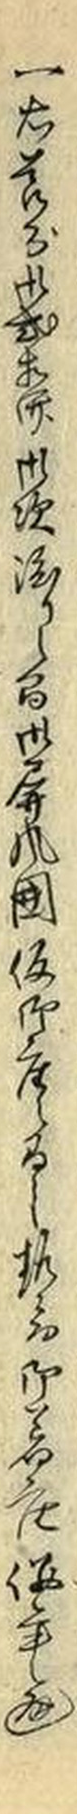一右節分御式相済御次溜之間御屏風囲仮御座之間之趣ニ而御着座例年之通
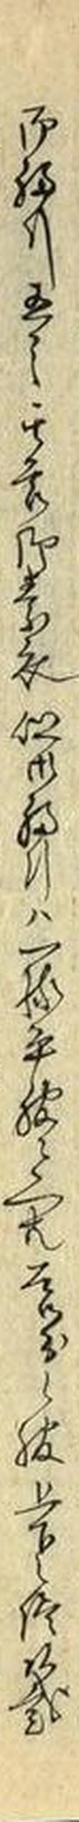御福引有之其節御素衣但御福引ハ一統平服ニ候へ共節分之服上下之侭頂戴
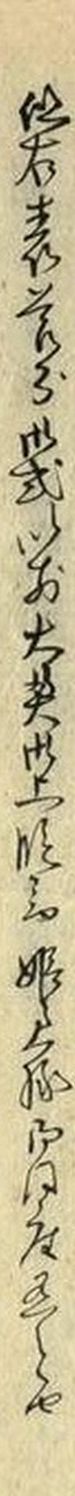但右表節分御式以前大奥御上段ニ而姫君様御同座有之由
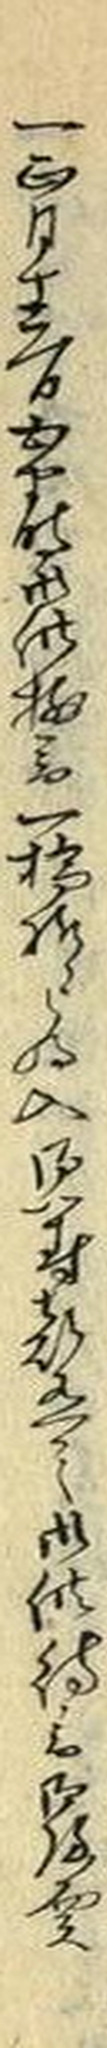一正月十三日五半時御供揃ニ而一橋様へ被為入御対顔有之御供待ニ而御帰殿
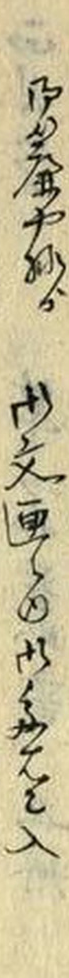御簾中様ゟ御文匣之内御たはこ入
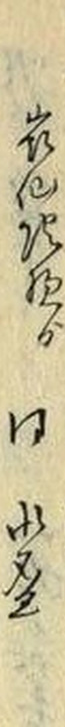嶺仙院様ゟ同御盃
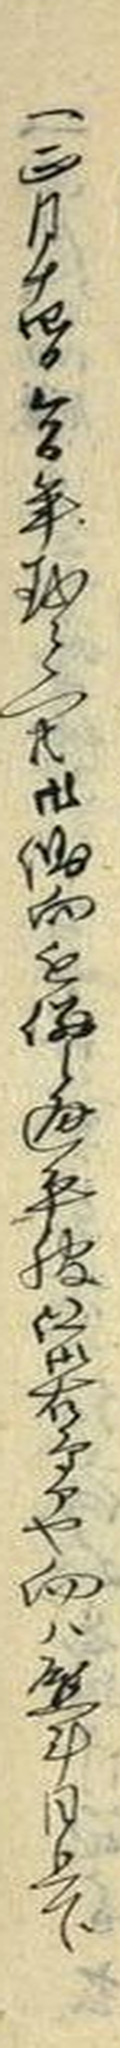一正月十四日今日年越ニ候へ共御側向近例之通平服但御右筆部や向ハ熨斗目上下
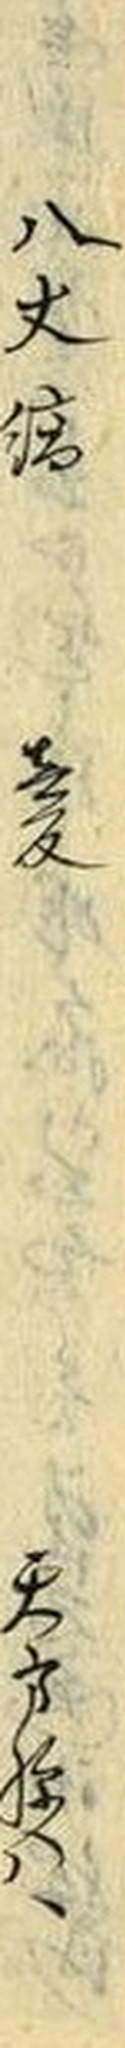八丈縞壱反天方孫八へ
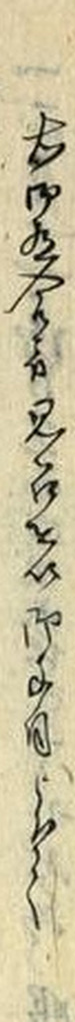右御有合ニ付思召を以御手自被下之
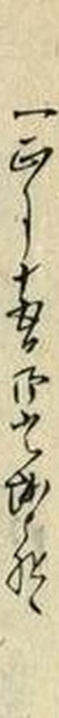一正月十五日御登城被遊候
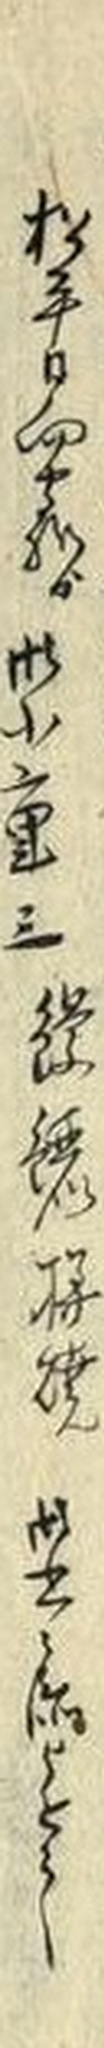松平日向様ゟ御小重三饅穂椛焼御書被添被進之
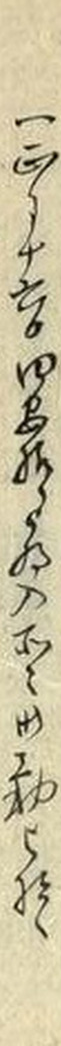一正月十六日田安様へ被為入所々御勤被遊候
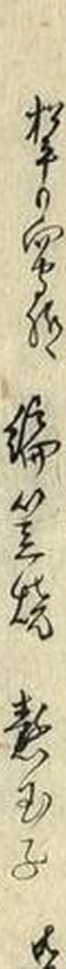松平日向守様へ編笠焼熬玉子
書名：少傅日録抄（斉承付側向頭取日記、在府）
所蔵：福井県文書館 Fukui Prefectural Archives
